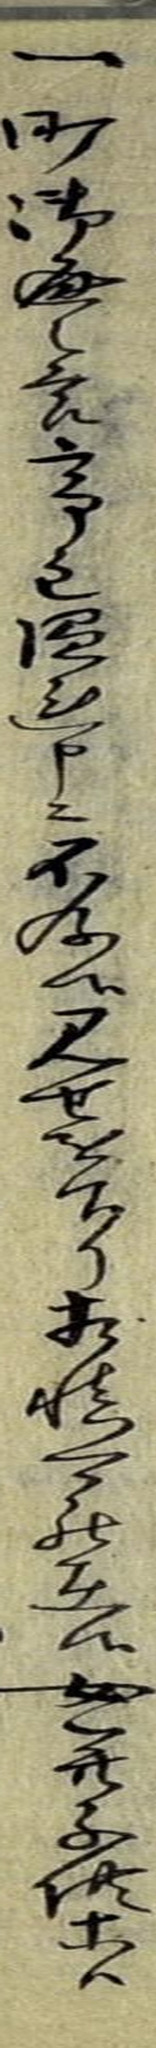一町御通之節亭主隠れ申ニ不及候見せを下り相慎可罷在候女并子供等ハ
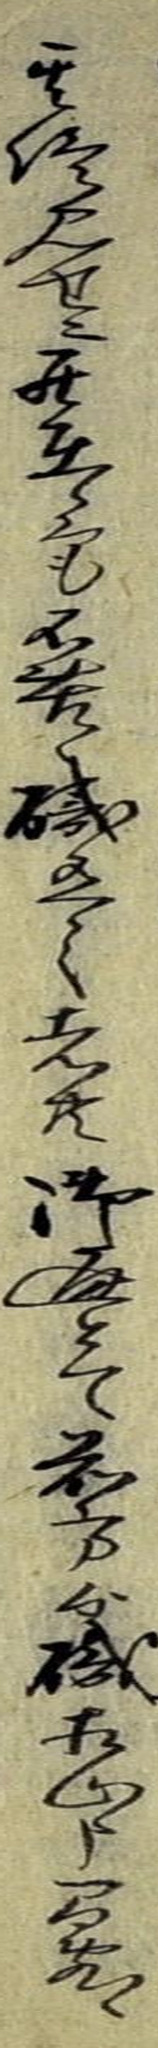其儘見せニ罷在候而も不苦職有之者共御通とて前方ゟ職相止申間敷候
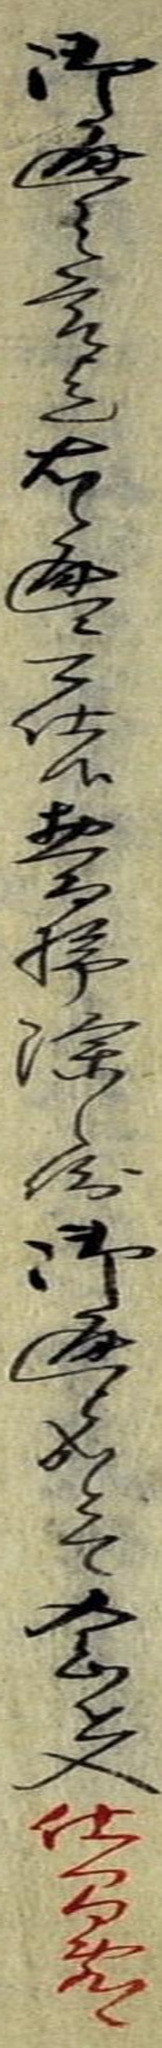御通之節迄右之通ニ可仕候惣而掃除之儀御通被成とて念を入仕間敷候
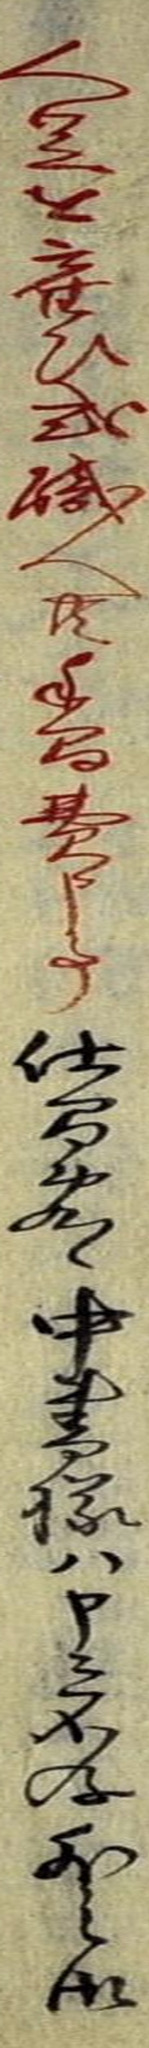人足を雇ひ或職人共手間費申事仕間敷候中書様ハ申ニ不及外之御
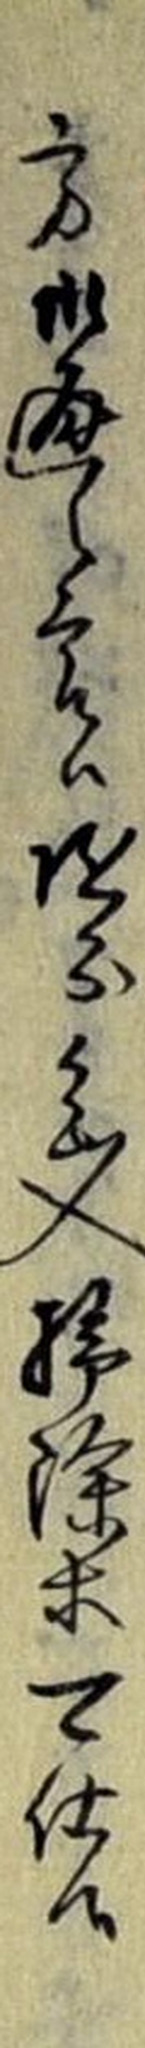方御通之節ハ随分念入掃除等可仕候
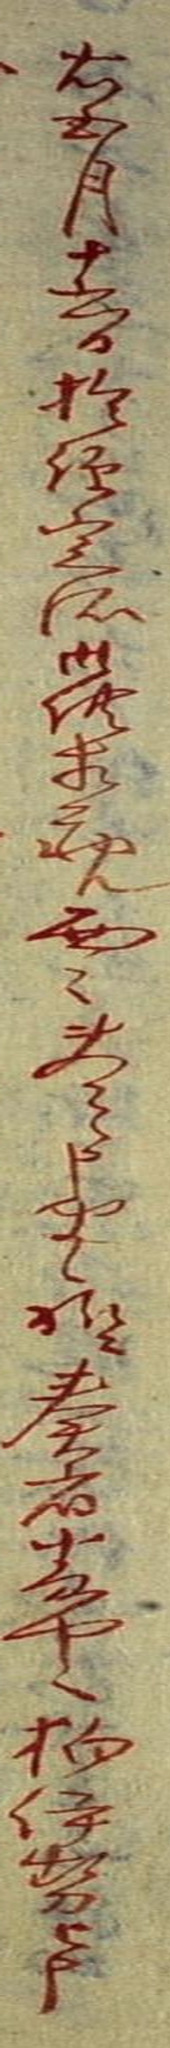右五月十六日於評定所御供相勤ル面々夫々へ申聞候様ニ奏者番中へ狛伊勢被申
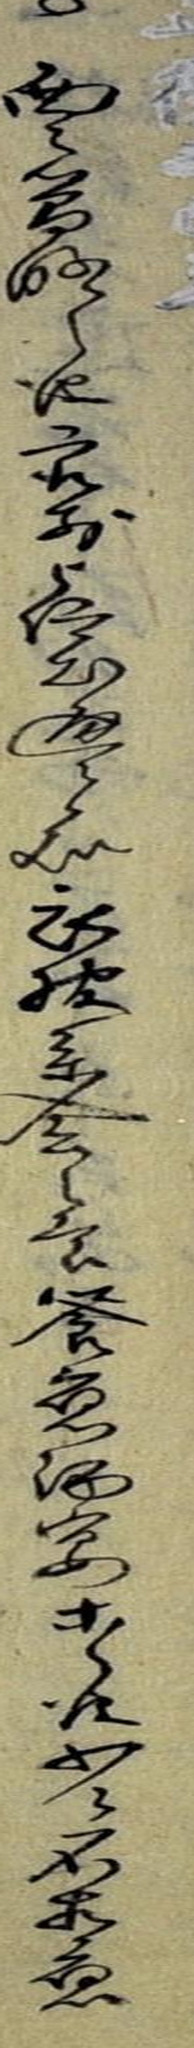〇面々簡略之儀最前被仰出通ニ候処衣服参会之節饗応酒宴等之儀少々不相応
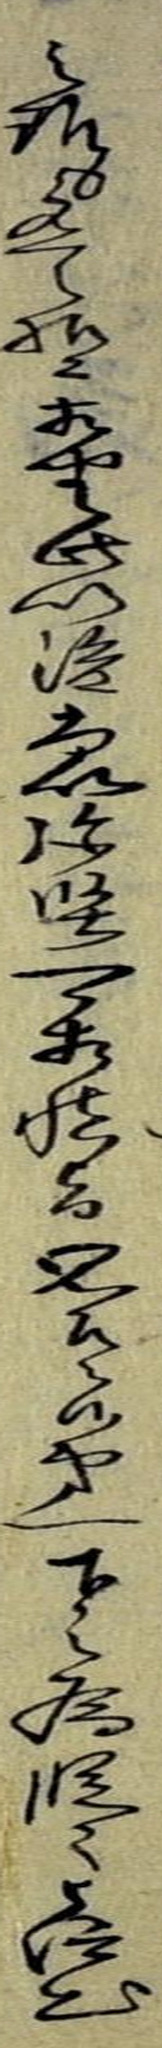之趣も有之様ニ相聞候此以後尚以弥堅可相慎旨思召ニ候第一下々之為段々被仰出
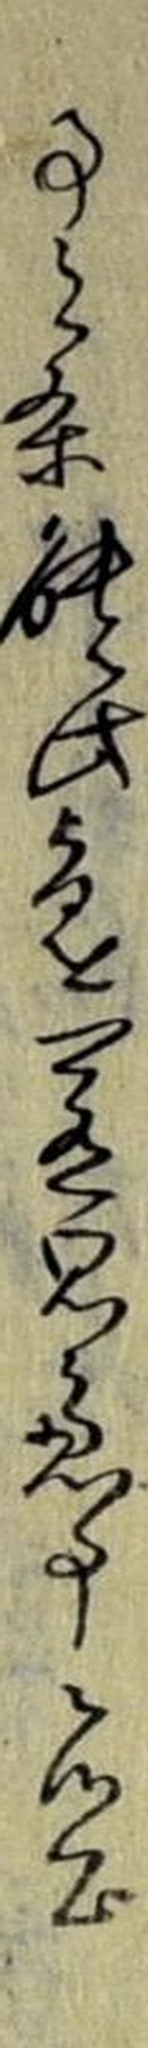事之条能々此旨を可有思慮事ニ候以上
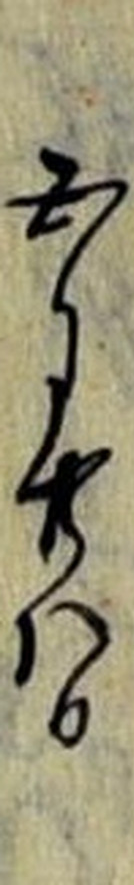五月廿八日
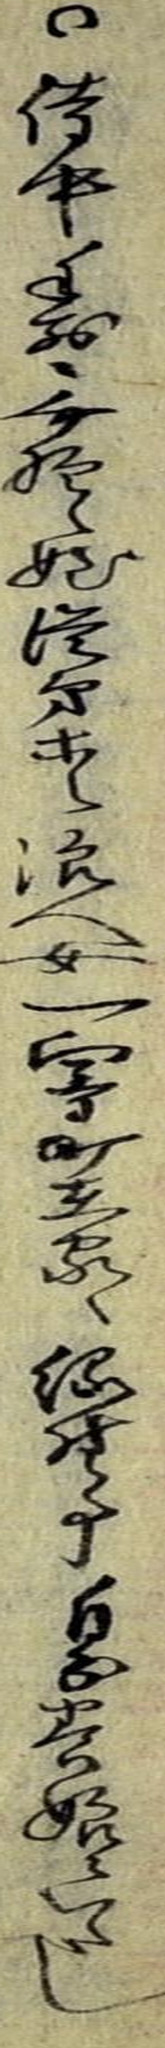〇侍中手前ニ介抱之姪従弟等之浪人女一向寺町在家へ縁付候事自分養娘ニいたし
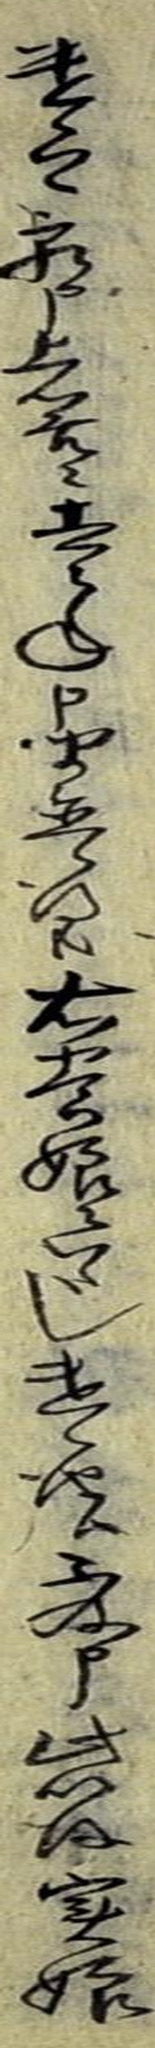遣候ハヽ願申上筈ニ去年申聞置候得共右養娘ニいたし遣候儀ハ不及申此以後実娘
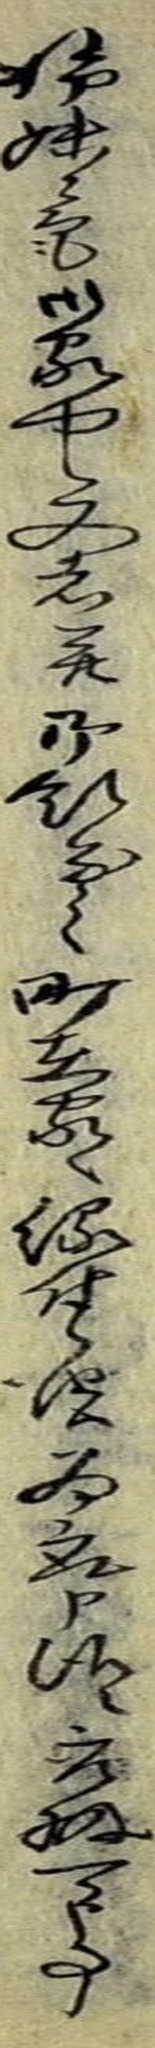姉妹ニ而も御家中之又者并御領分之町在家へ縁付候儀ハ為取申趣ニ取扱可申事
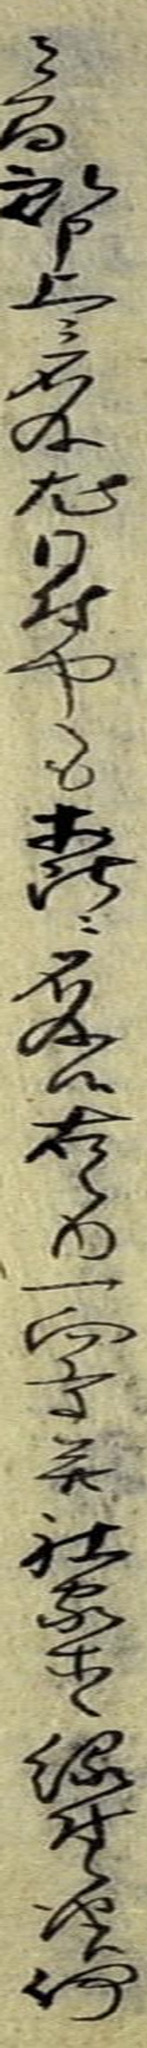ニ候間願申上ニ不及尤目付中へも相断ニ不及候右之内一向寺并社家等へ縁付候儀ハ何
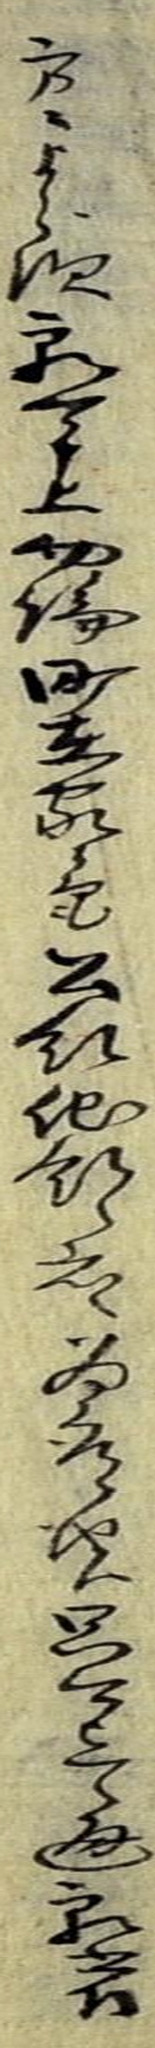方ニよらす願可申上勿論町在家ニ而も公領他領之者へ為取候儀ハ只今迄之通願書付
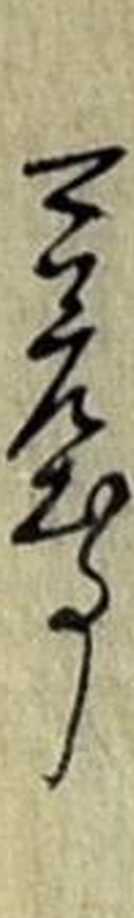可差出事
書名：命令之部 一
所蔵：福井県文書館 Fukui Prefectural Archives
